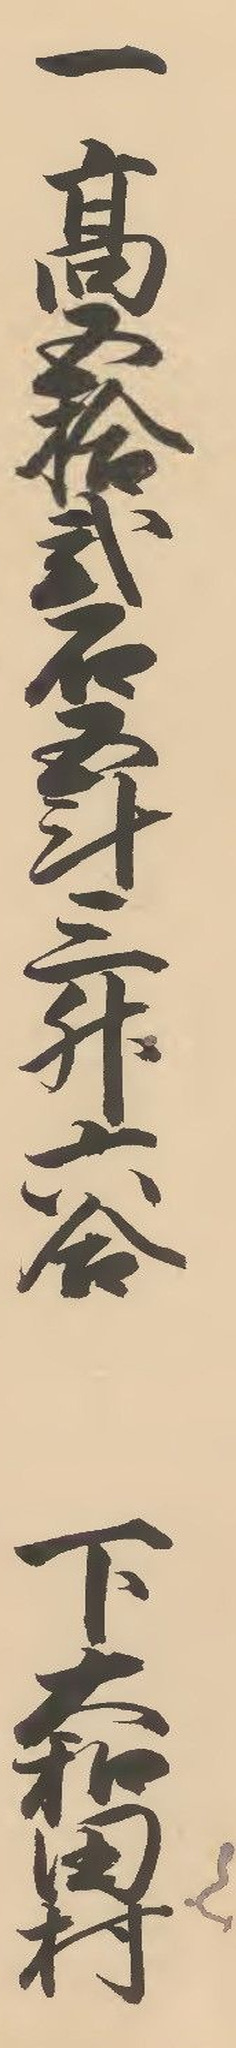一高五拾弐石五斗三升六合下大和田村

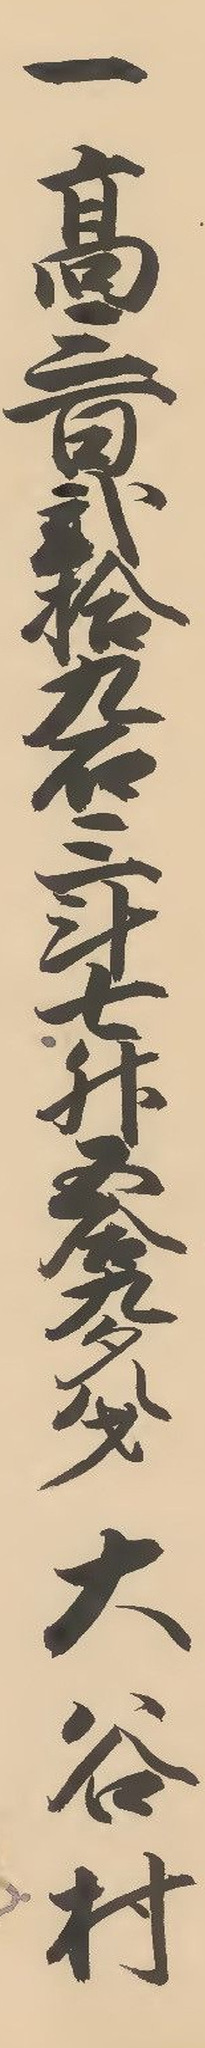一高三百弐拾九石三斗七升五合九勺八才大谷村
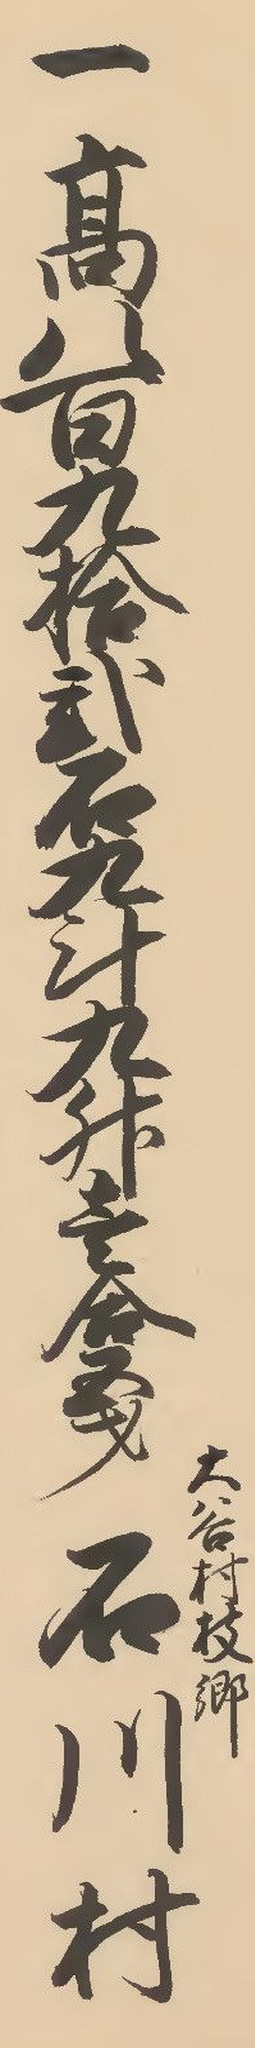一高八百九拾弐石九斗九升壱合五才石川村
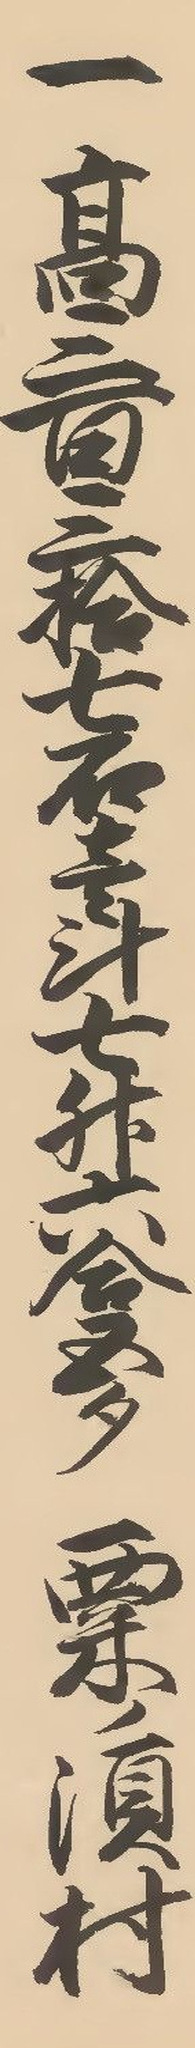一高三百三拾七石壱斗七升六合五勺粟ノ須村
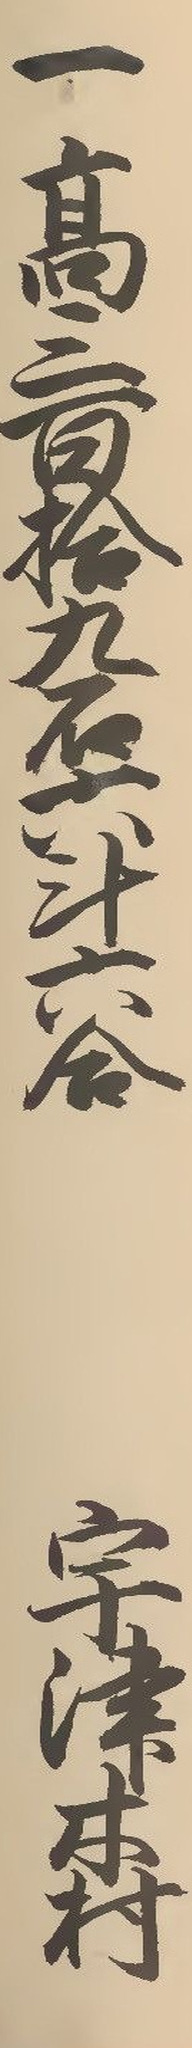一高三百拾九石六斗六合字津木村
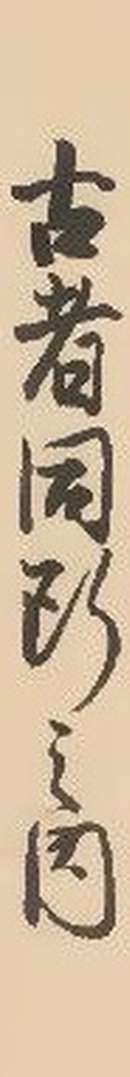古者同断之内
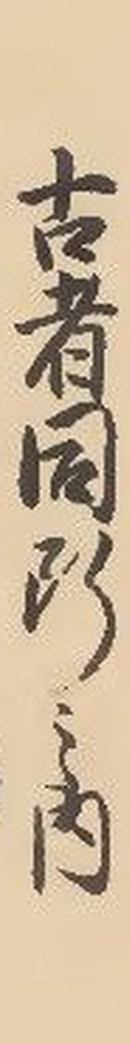古者同断之内
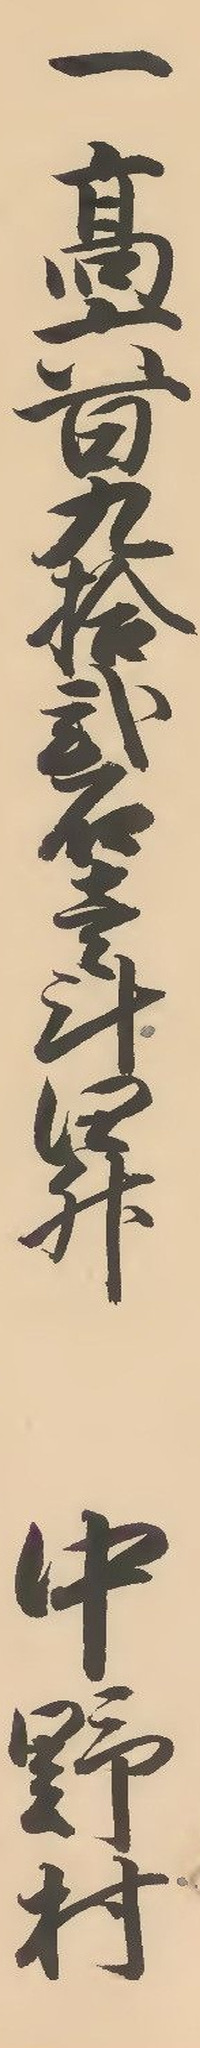一高六百九拾弐石壱斗四升中野村

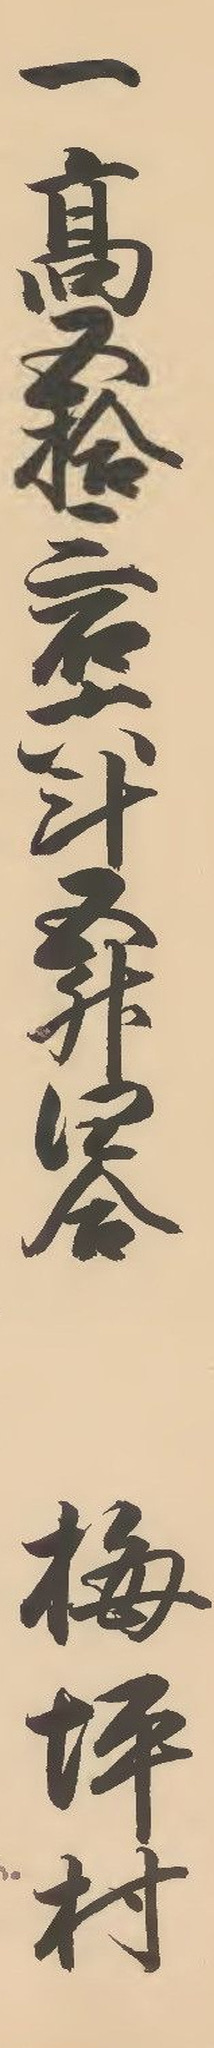一高五拾三石六斗五升四合梅坪村
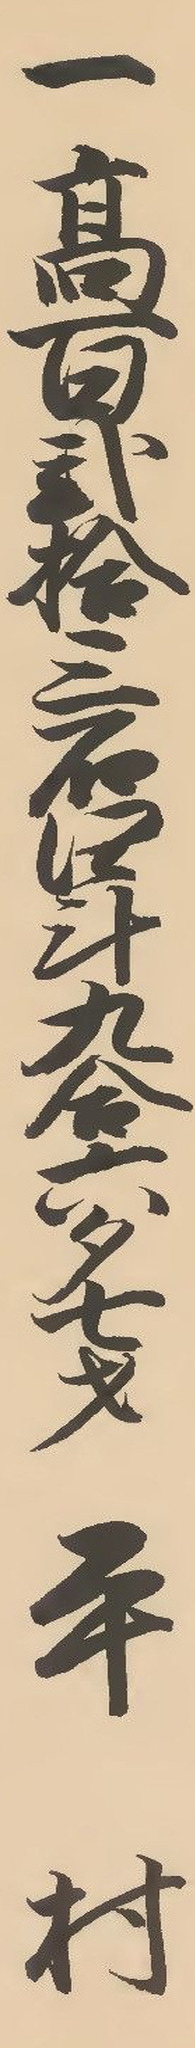一高百弐拾三石四斗九合六勺七才平村
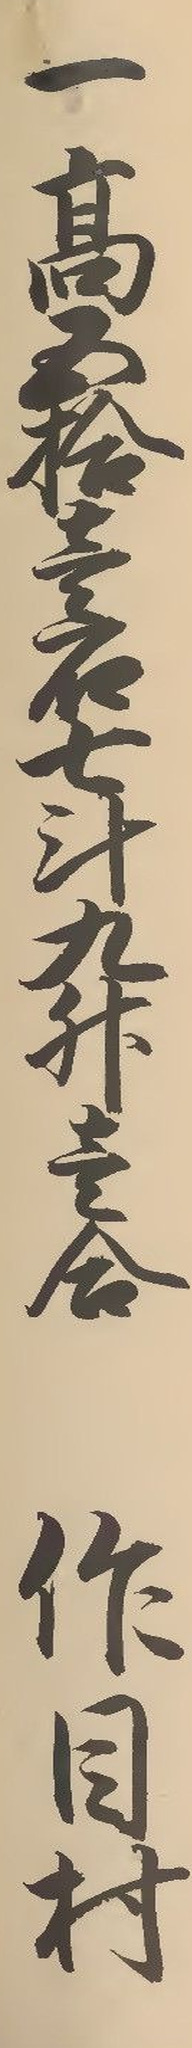一高五拾壱石七斗九升壱合作目村
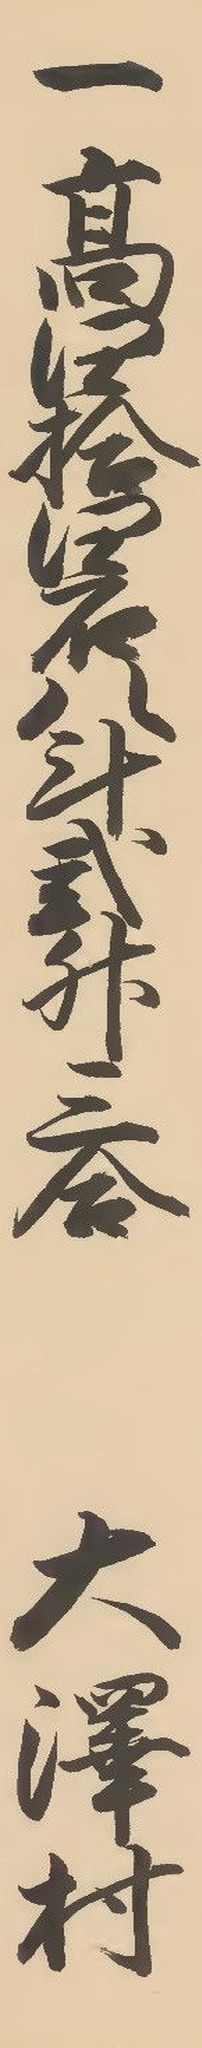一高四拾四石八斗弐升三合大澤村
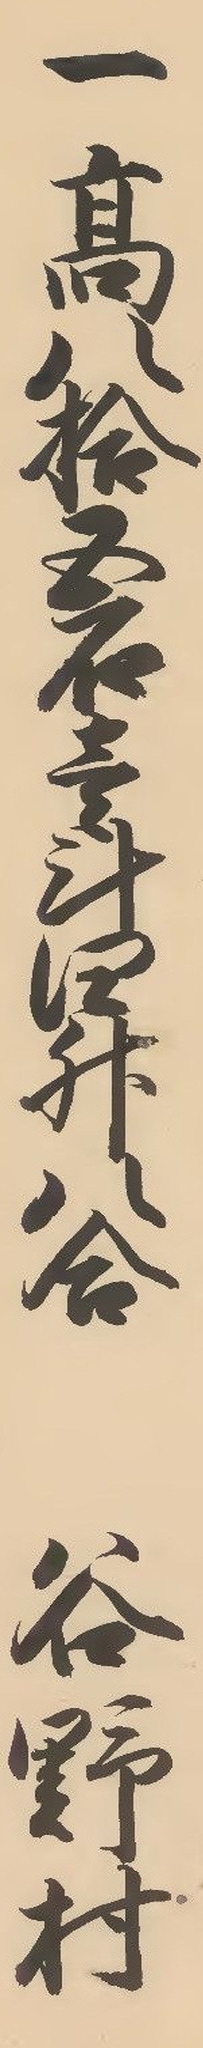一高八拾五石壱斗四升八合谷野村

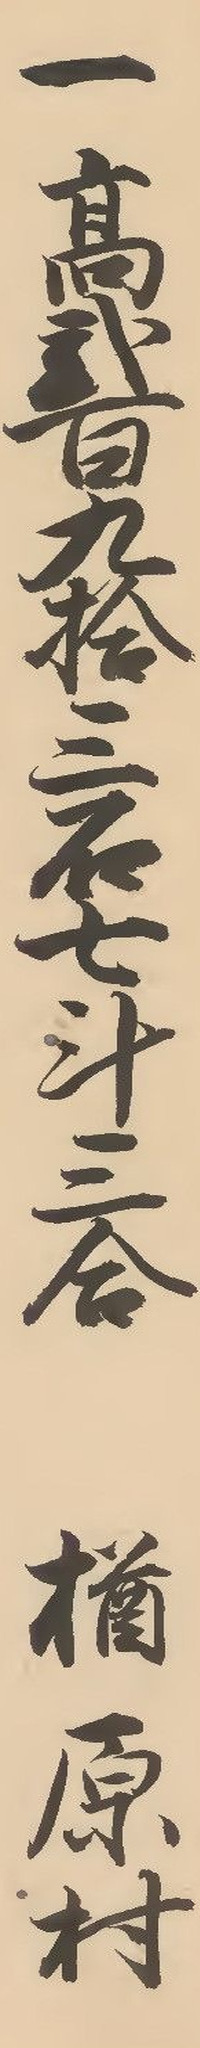一高弐百九拾三石七斗三合楢原村
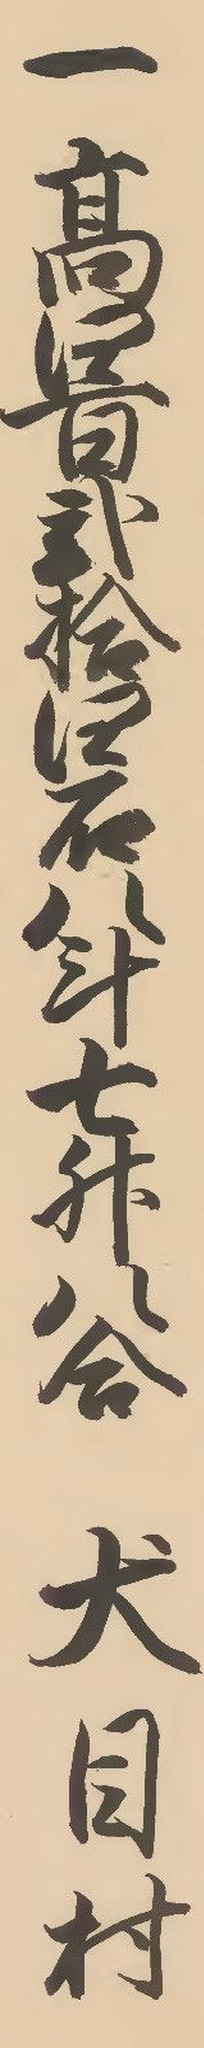一高四百弐拾四石八斗七升八合犬目村
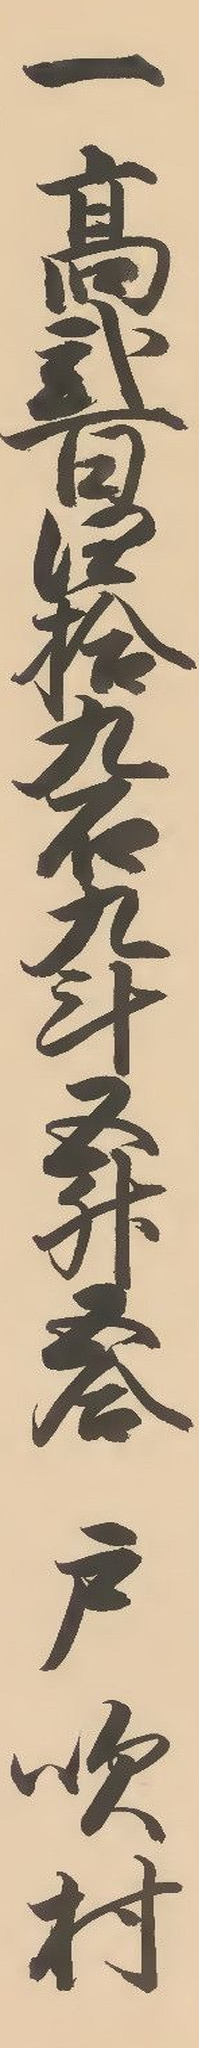一高弐百四拾九石九斗五升五合戸吹村
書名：武蔵国郷帳　上
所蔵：国立公文書館 National Archives of Japan
